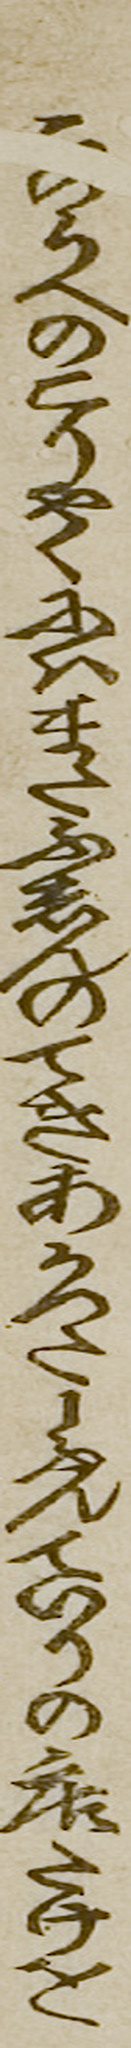このうへのこりやくにはまたふしんのてきあかつたしふんていりの店たけを
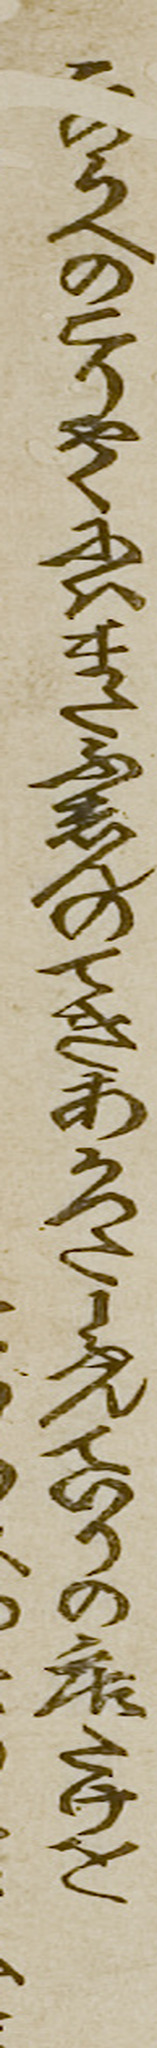このうへのこりやくにはまたふしんのてきあかつたしふんていりの店たけを
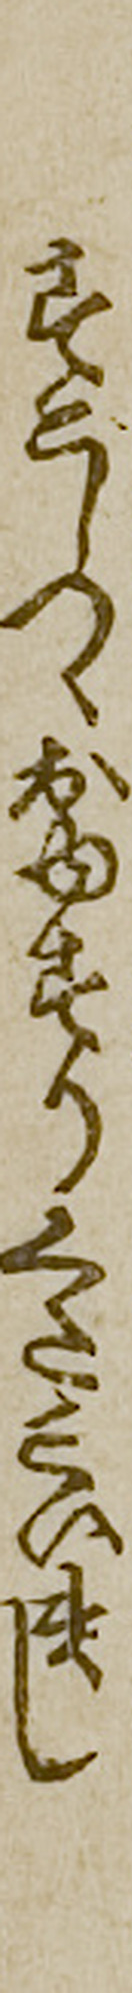すこしつゝおゆすりくたさいまし
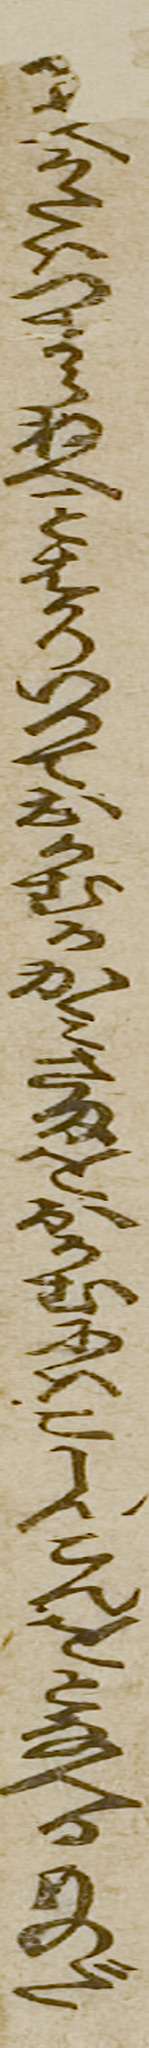かたはつまらねへことはかりいつておかむかかみさまをおかむにはこしんこんをとなへるものだ
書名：出現苦動明王
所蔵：東京大学総合図書館 General Library in the University of Tokyo, JAPAN
